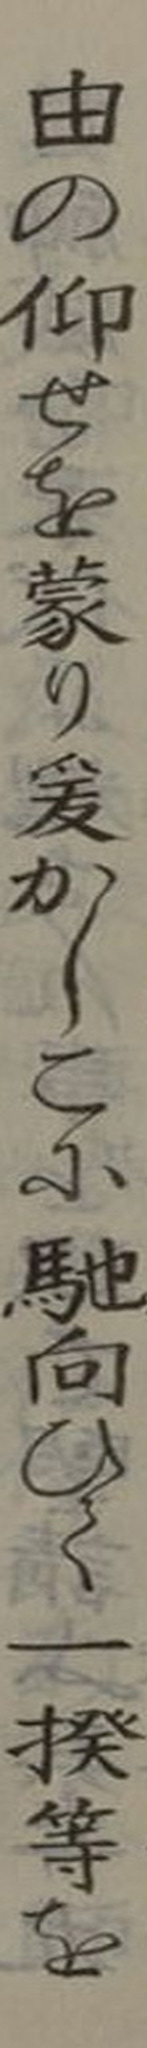由の仰せを蒙り爰かしこに馳向ひて一揆等を
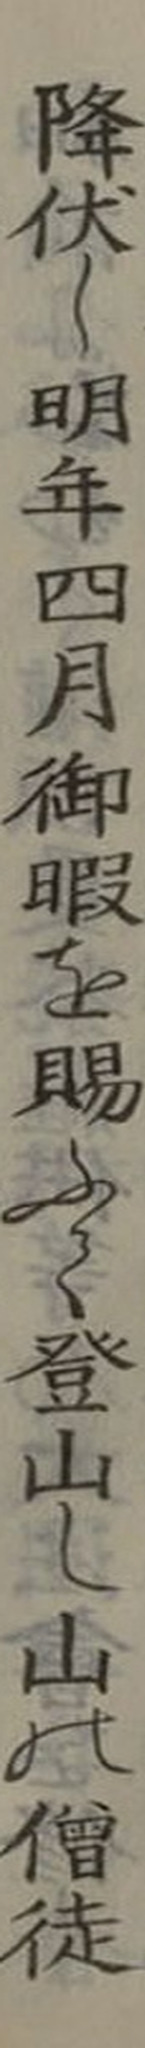降伏し明年四月御暇を賜ふて登山し山の僧徒
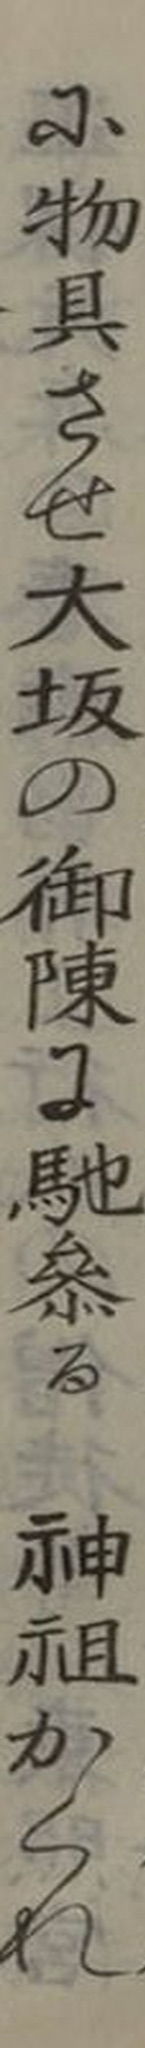に物具させ大坂の御陳に馳參る神祖かくれ
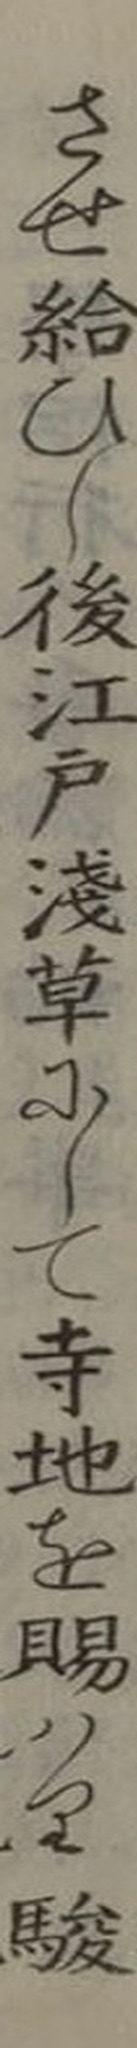させ給ひし後江戶淺草にして寺地を賜はり駿
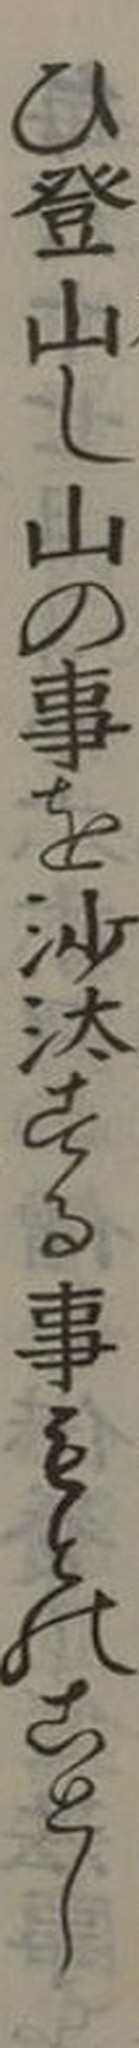ひ登山し山の事を沙汰する事もとのことし
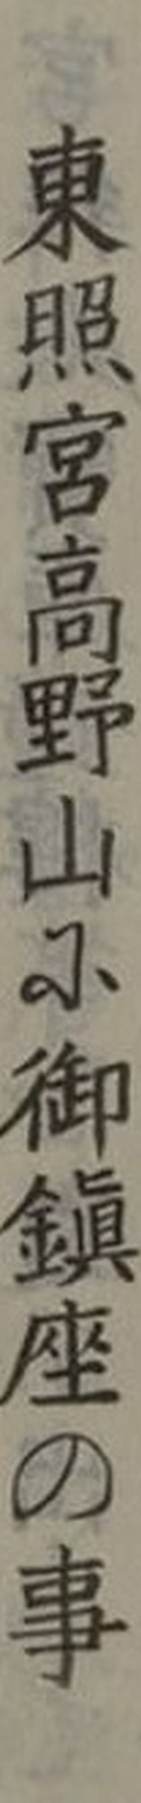東照宮高野山に御鎭座の事
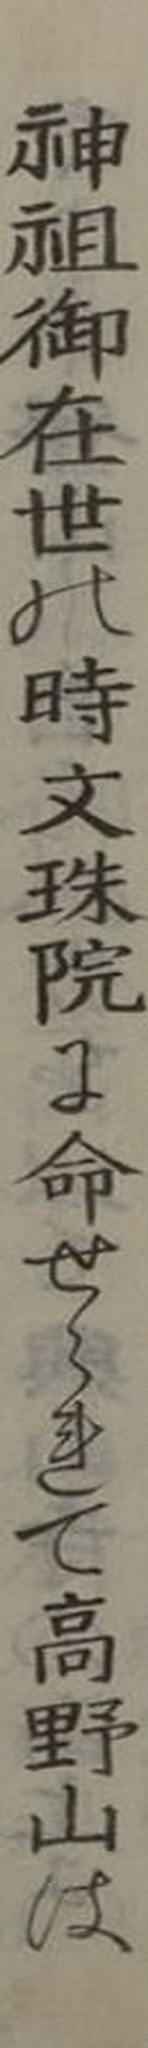神祖御在世の時文珠院に命せられて高野山は
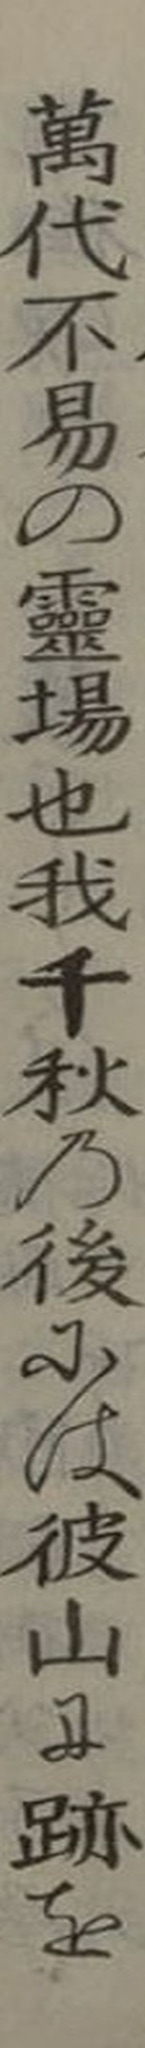萬代不易の靈場也我千秋の後には彼山に跡を
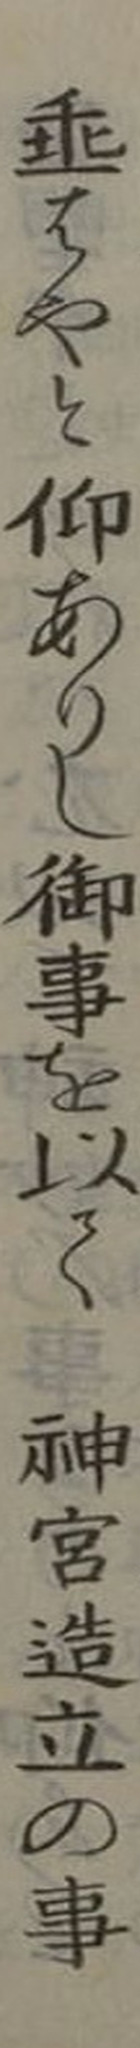垂はやと仰ありし御事を以て神宮造立の事

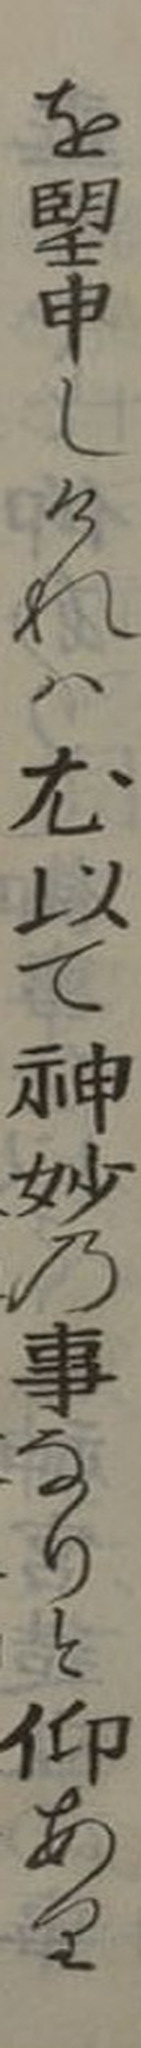を朢申しけれは尤以て神妙の事なりと仰あり
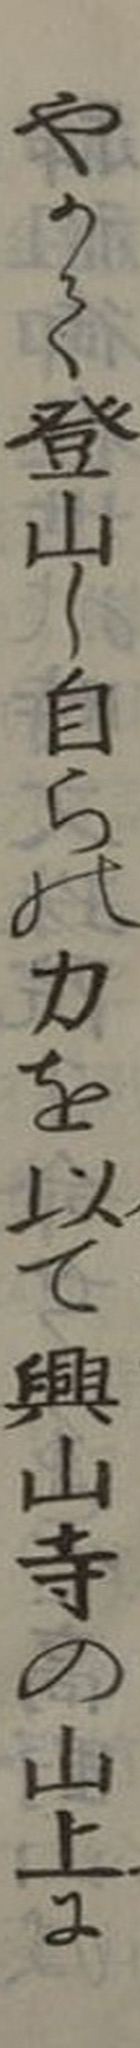やかて登山し自らの力を以て興山寺の山上に
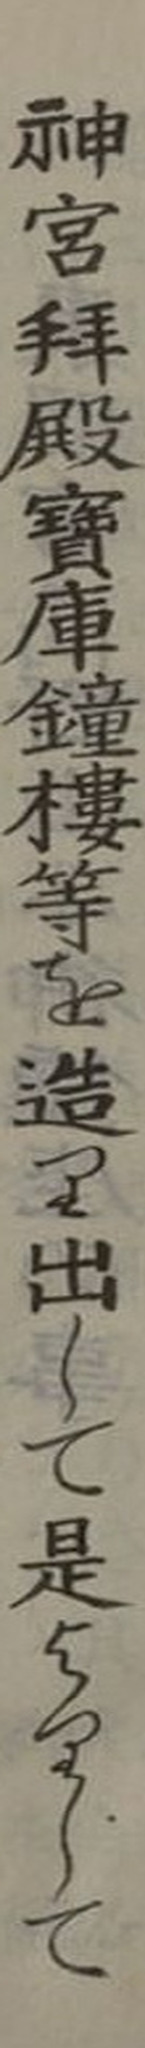神宮拜殿寶庫鐘樓等を造り出して是よりして
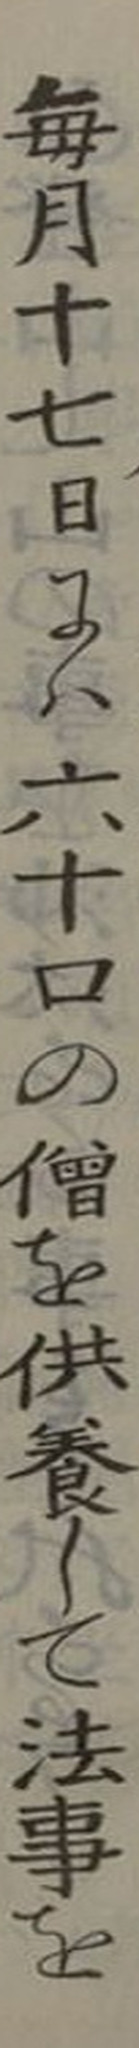毎月十七日には六十口の僧を供養して法事を
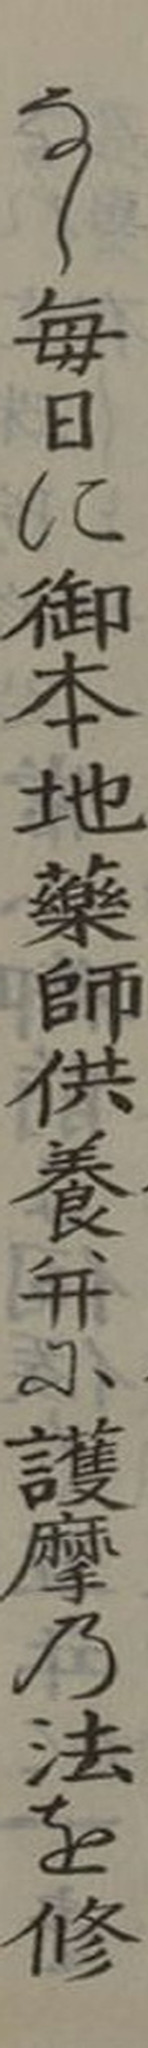なし毎日に御本地藥師供養并に護摩の法を修
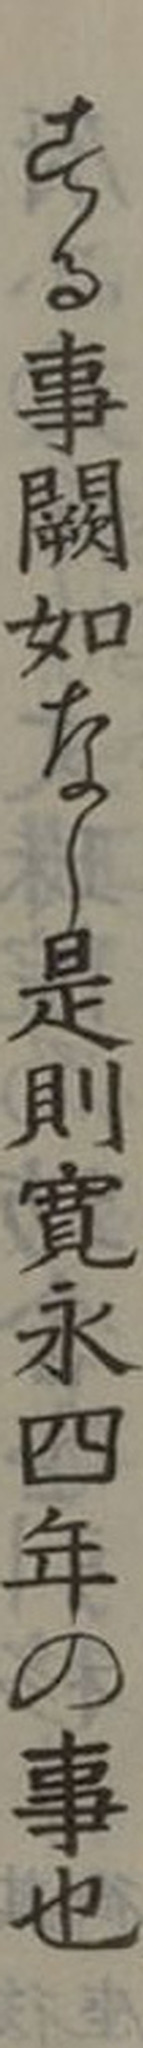する事闕如なし是則寛永四年の事也
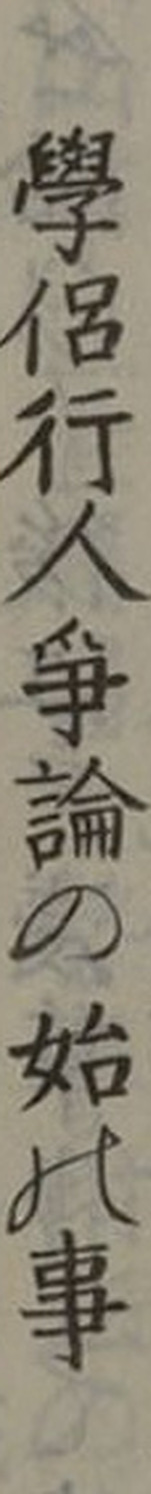學侶行人爭論の始の事
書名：骨董録
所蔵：University of the Ryukyus Library
